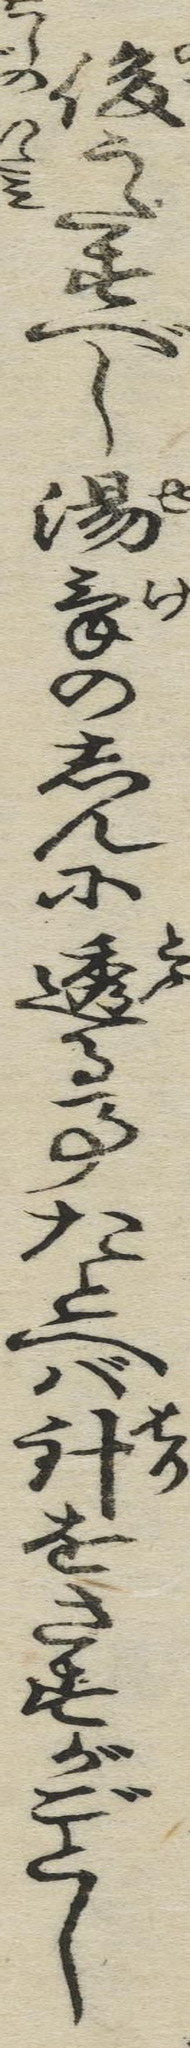後うたすべし湯氣のしんに透る事たとへば針をさすがごとし
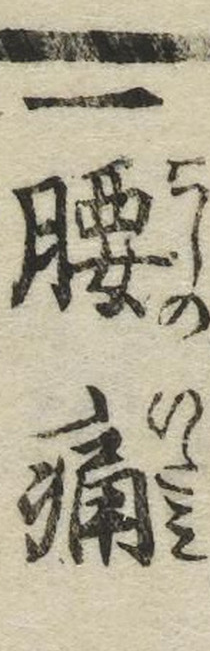一腰痛
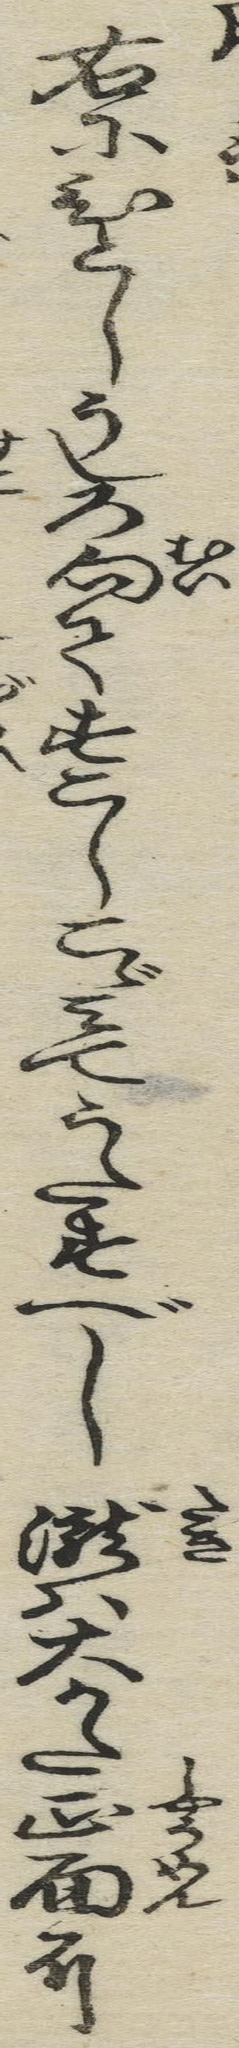右にひとしうしろ向てすこしこゞみてうたすべし瀧は大かた正面に
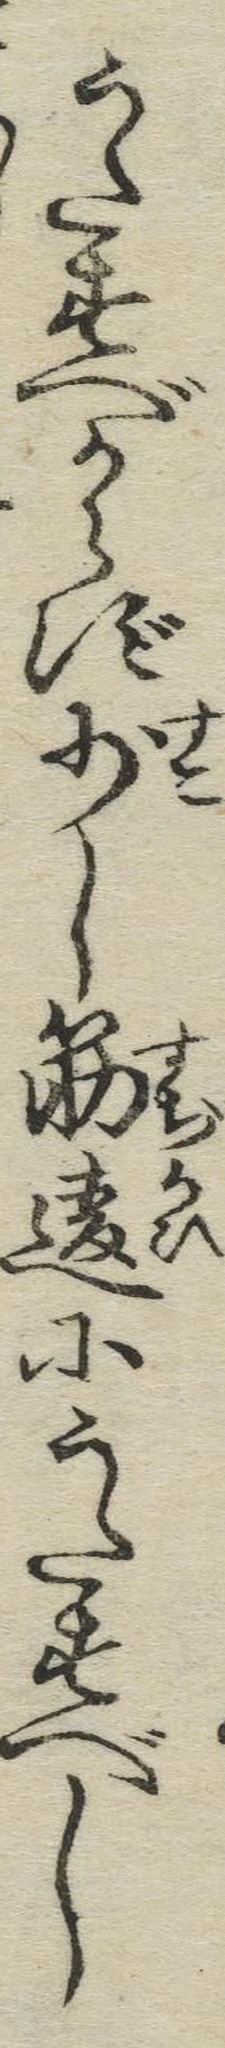うたすべからず少し筋違にうたすべし
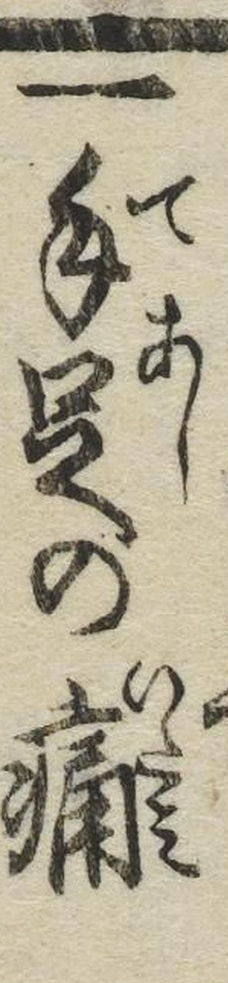一手足の痛
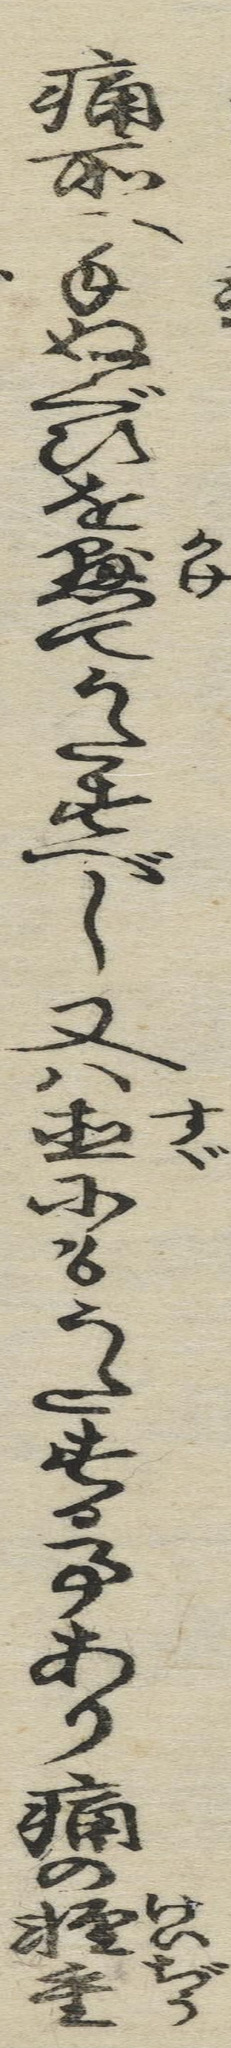痛所へ手ぬぐひを懸てうたすべし又直にもうたする事あり痛の軽重
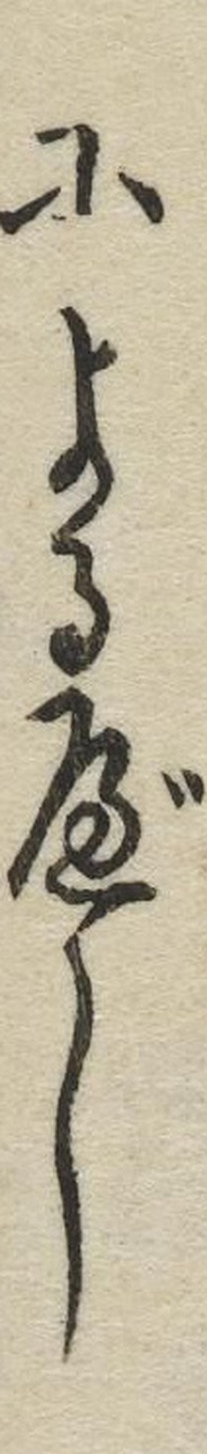によるべし
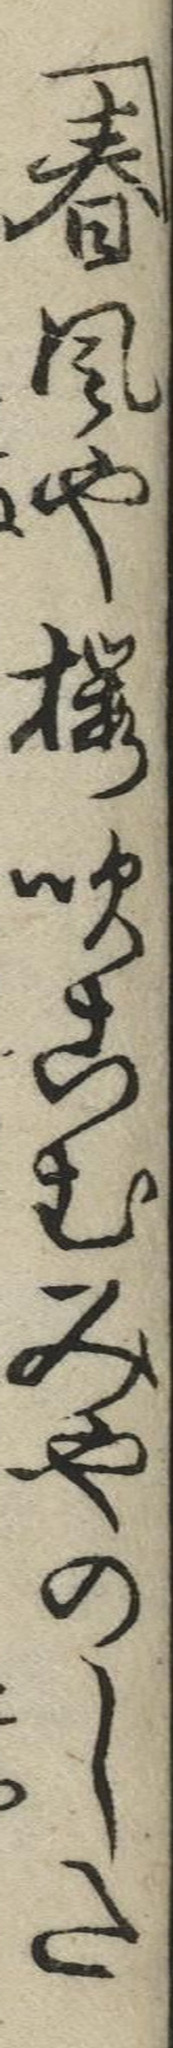〽春風や桜吹こむみやのした同
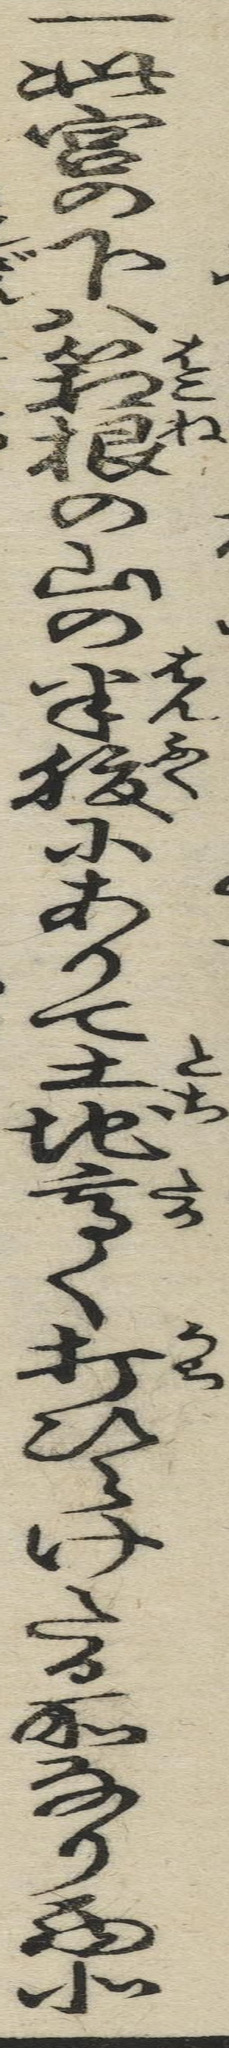一此宮の下は箱根の山の半腹にありて土地高く打ひらけたる所なり西と
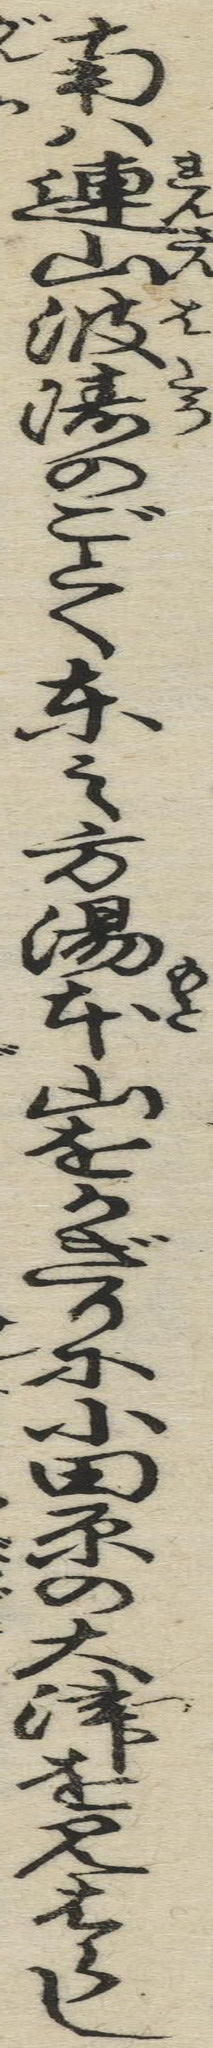南は連山波濤のごとく東の方湯本山をかぎりに小田原の大津を見はらし
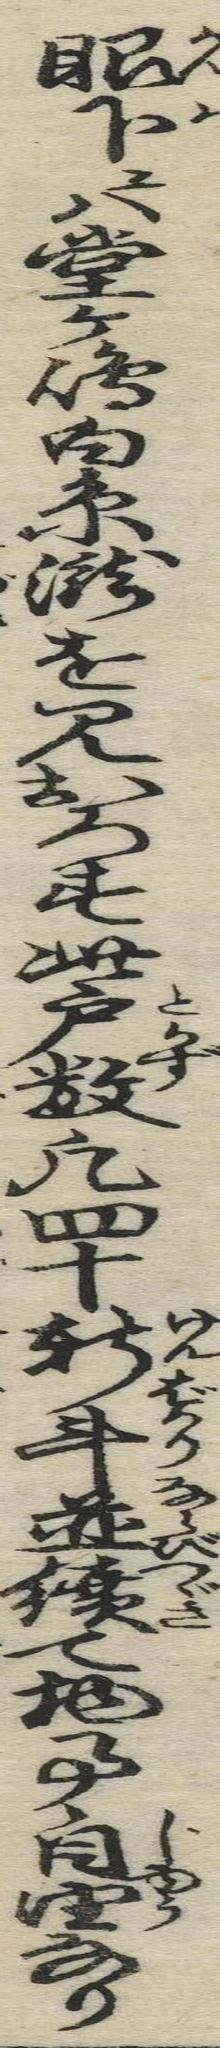眼下には堂ヶ峰白糸瀧を見おろす此戸数凢四十軒斗並續て物事自由なり
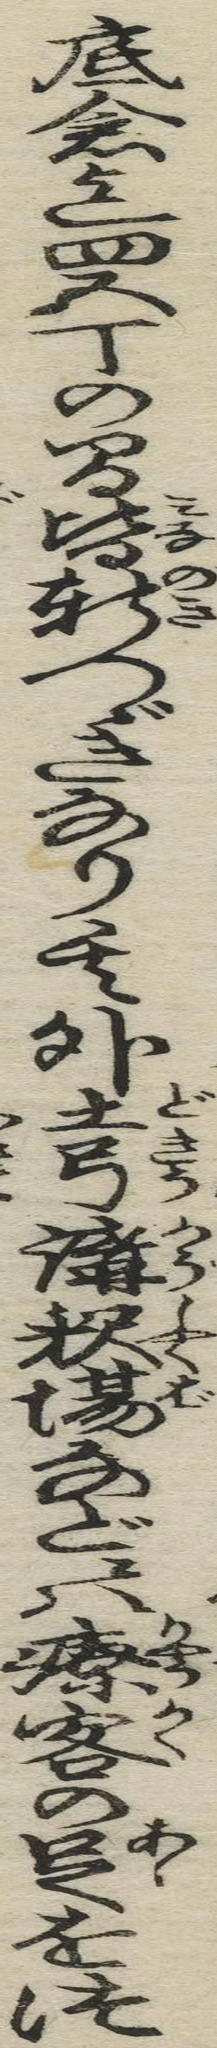底倉より四五丁の間皆軒つゞきなり其外土弓講釈場などには療客の足をつ
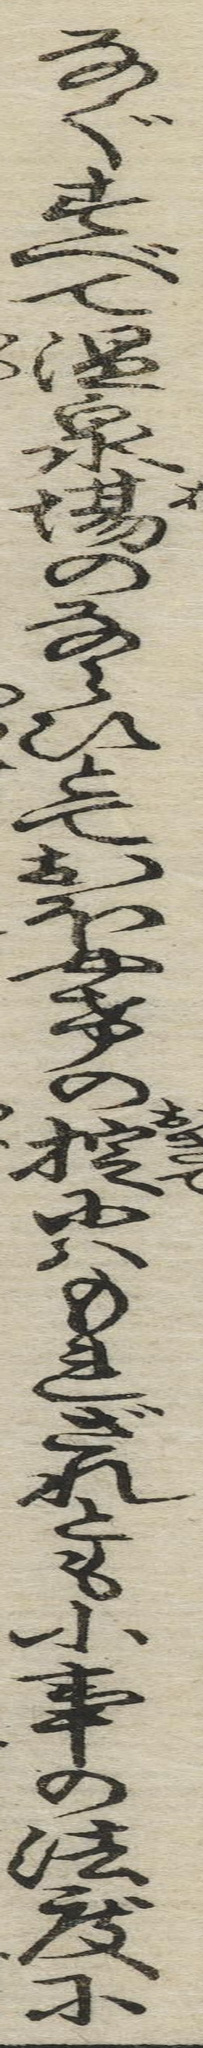なぐすべて温泉場のならひとておほゆけの掟にはもれざれとも小事の法度に
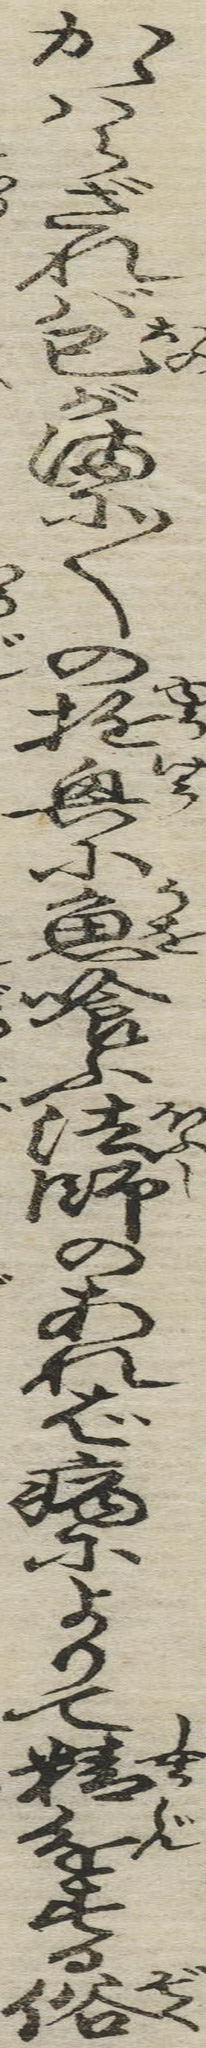かゝはらざれば己がまに〳〵の遊興小魚喰ふ法師のあれば病によりて精進する俗
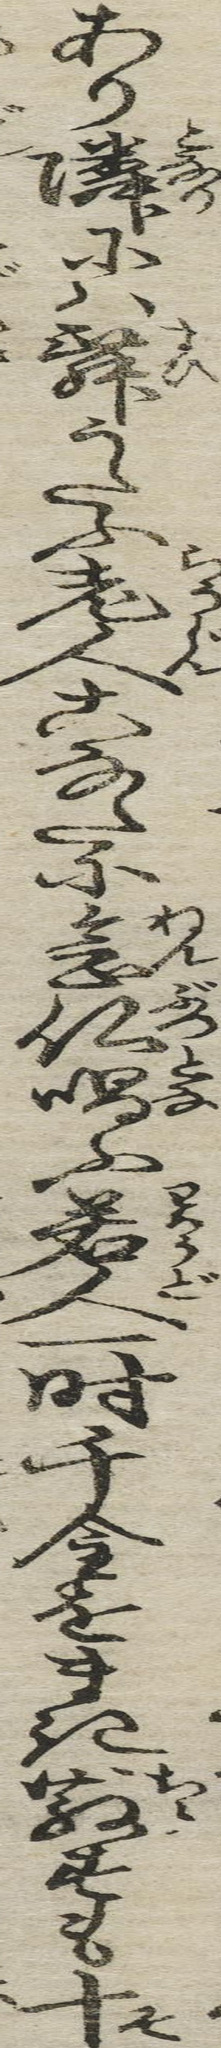あり隣には舞うたふ老人こなたに念仏唱ふ若人一時千金をまき散すも十
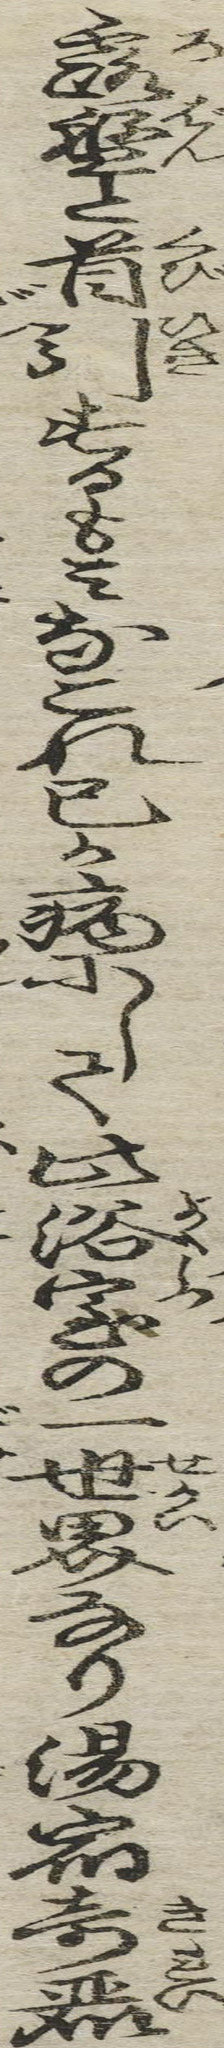露盤と首引するもみなこれ己か病にして此浴室の一世界なり湯宿奇麗
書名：箱根七湯　温泉圖會　全
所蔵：東京大学地震研究所図書室 Earthquake Research Institute Library, The University of Tokyo, JAPAN
